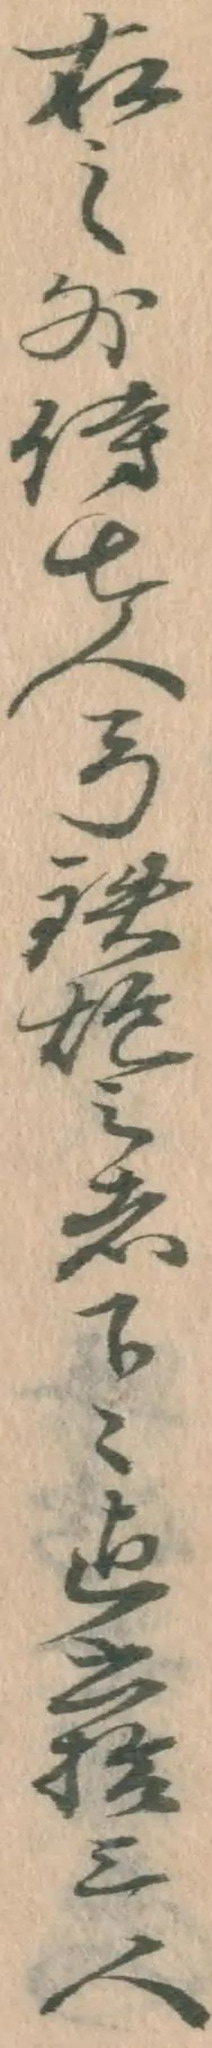右之外侍七人弓鉄炮之者下々迄六拾三人
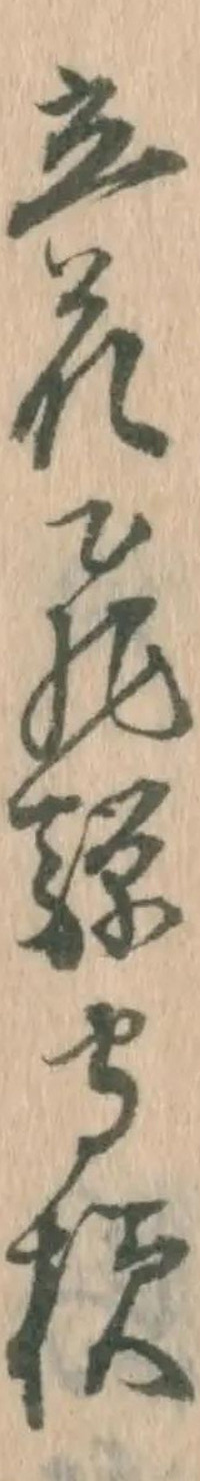立花飛騨守様
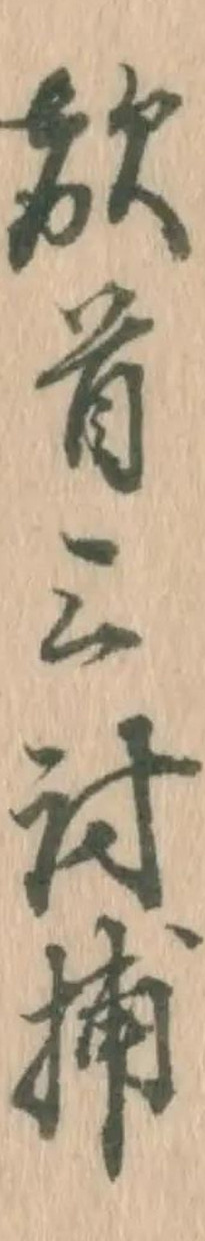敵首三討捕
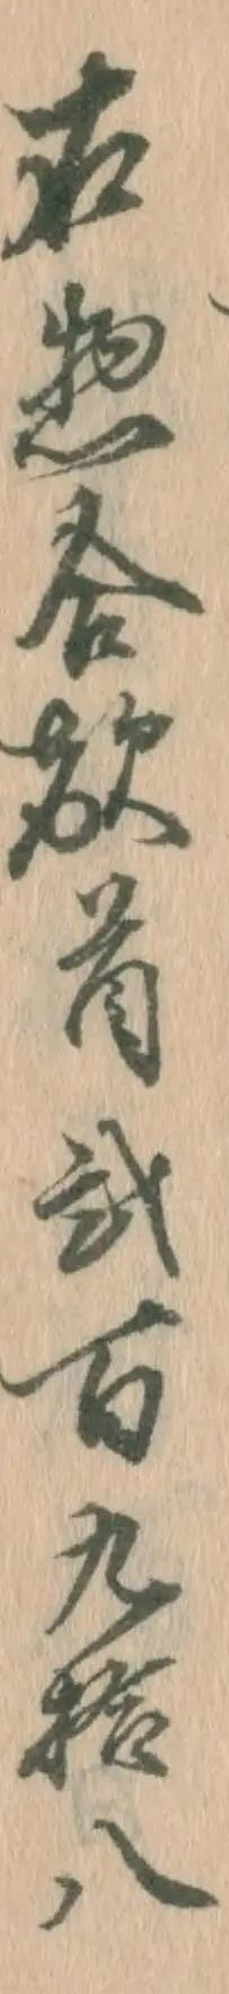右惣合敵首弐百九拾八
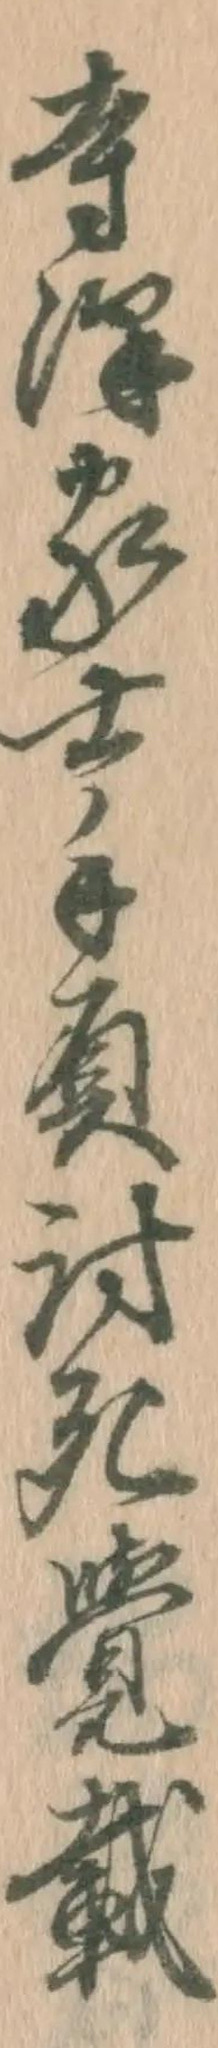寺沢家士手負討死覚載
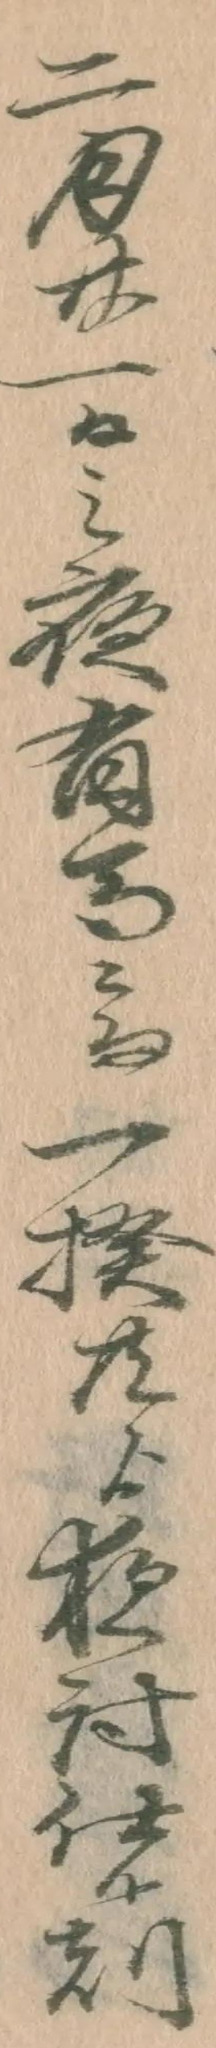二月廿一日之夜有馬に而一揆共ゟ夜討仕候刻
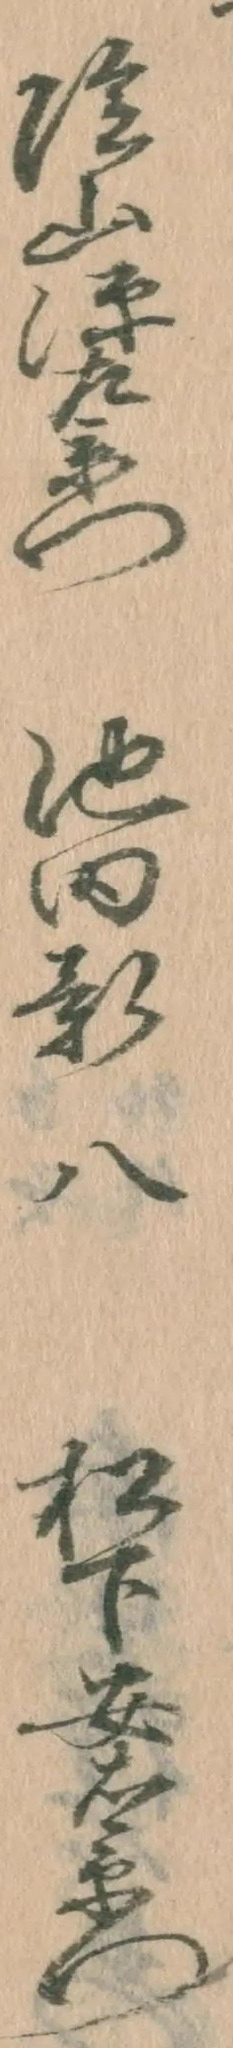陰山源左衛門池田新八松下安右衛門
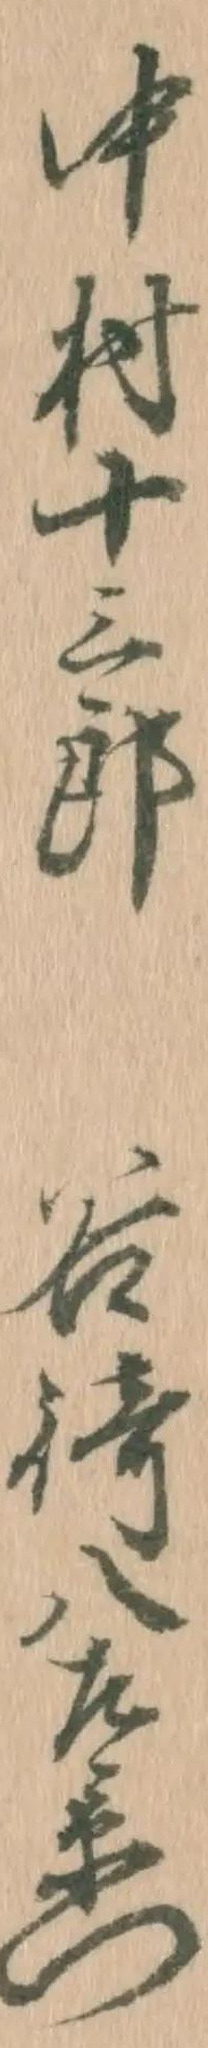中村十三郎谷崎八左衛門
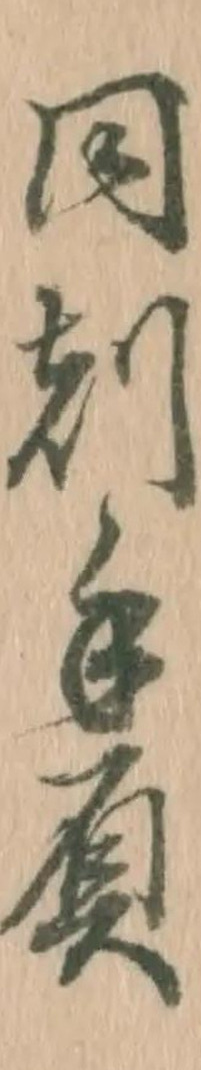同刻手負
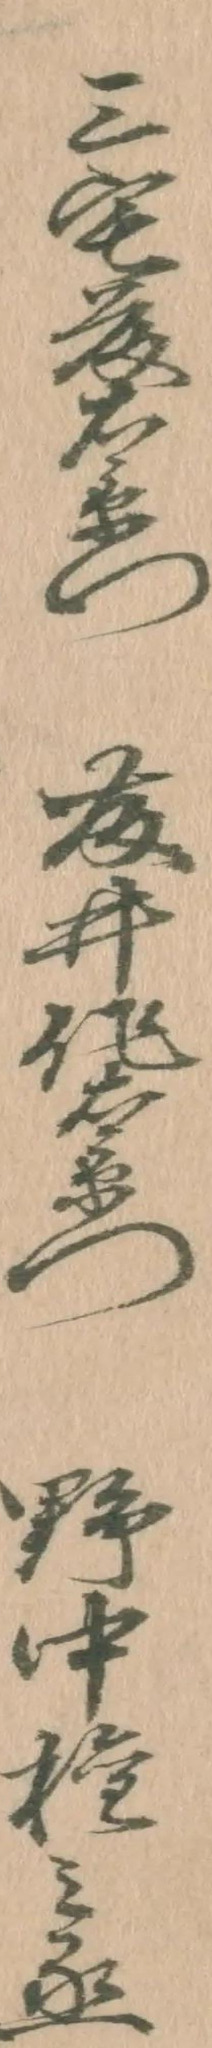三宅藤右衛門藤井作右衛門野中権之丞
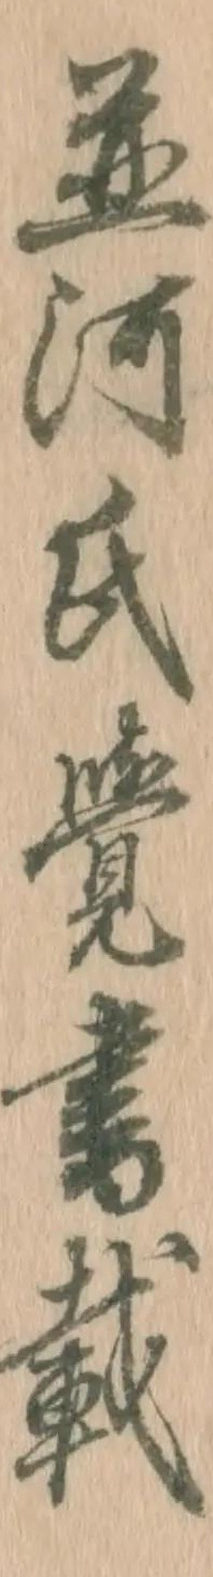並河氏覚書載
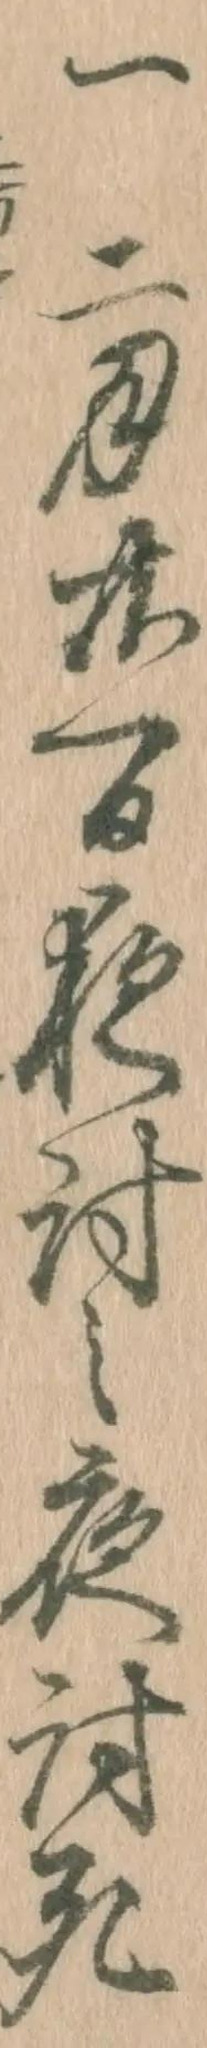一二月廿一日夜討之夜討死
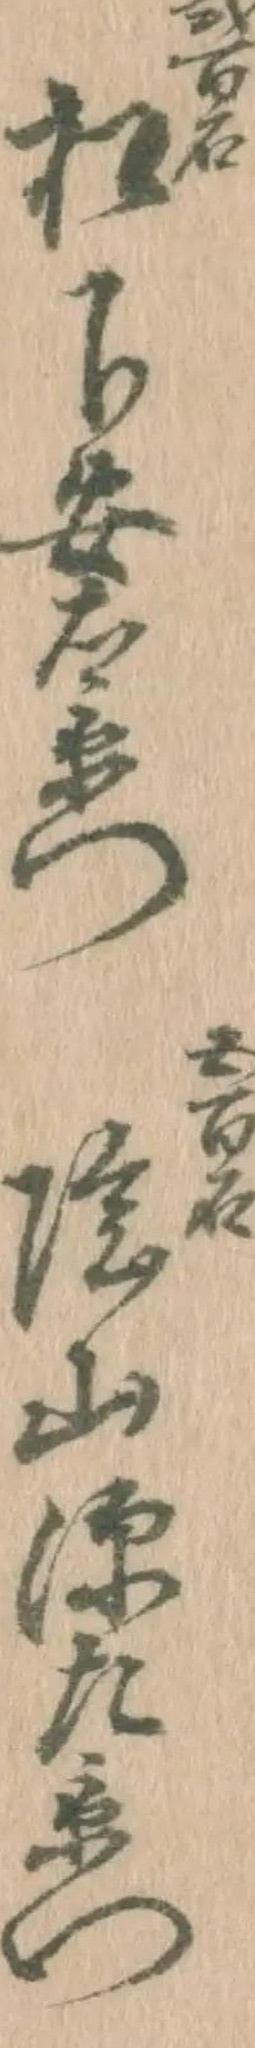松下安右衛門陰山源左衛門
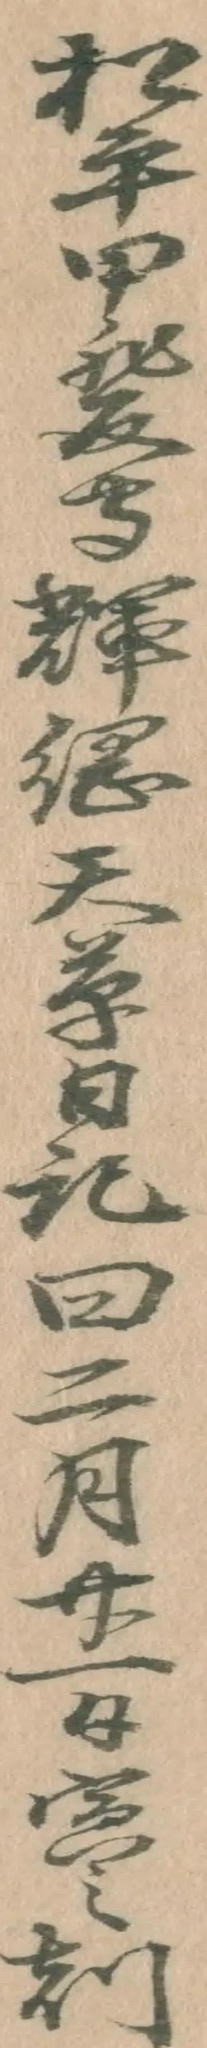松平甲斐守輝綱天草日記曰二月廿一日寅之刻
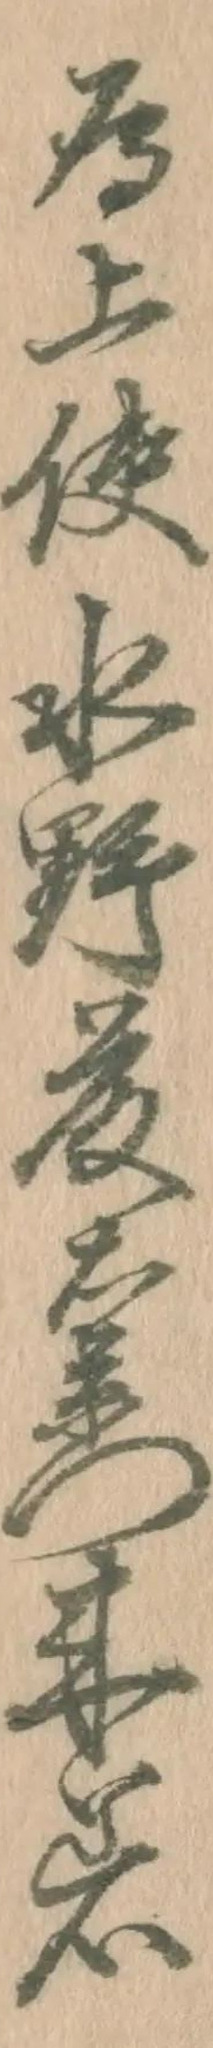為上使水野藤右衛門来着

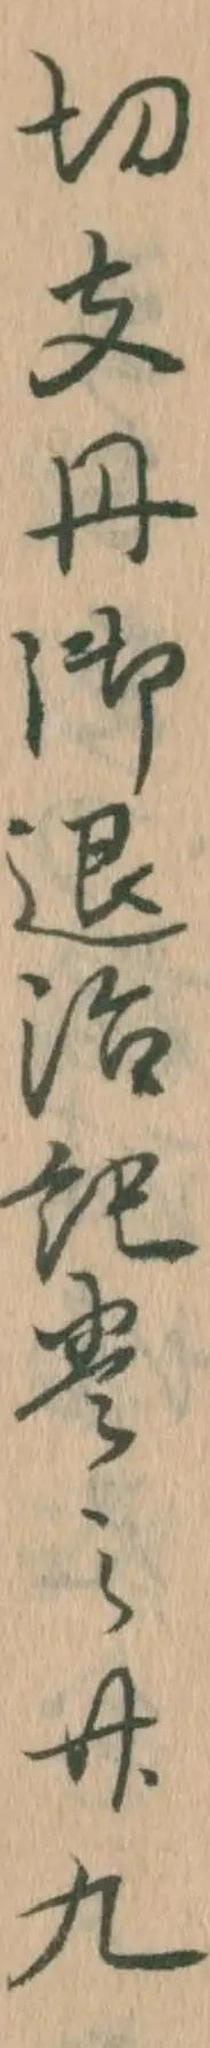切支丹御退治記巻之廿九
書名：切支丹御退治記 49巻. [7]
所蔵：国立国会図書館 National Diet Library, JAPAN
